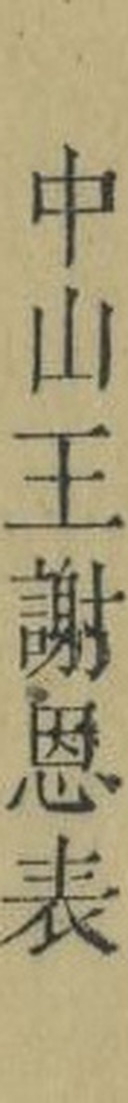中山王謝恩表
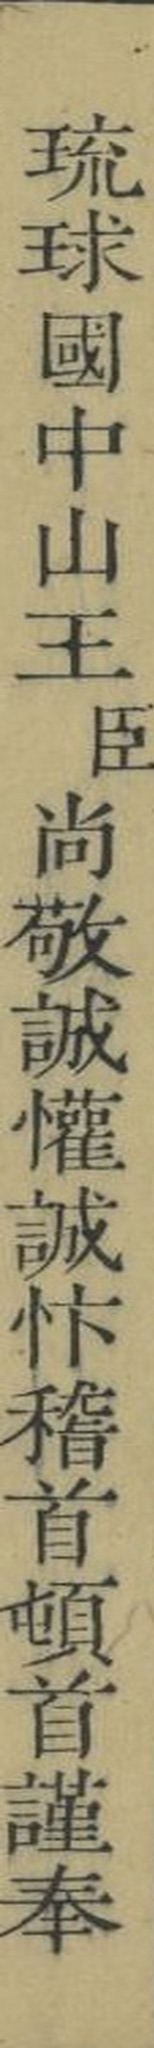琉球國中山王臣尚敬誠懽誠忭稽首頓首謹奉
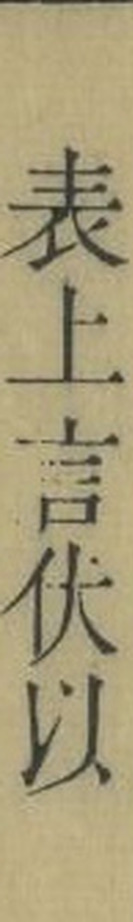表上言伏以
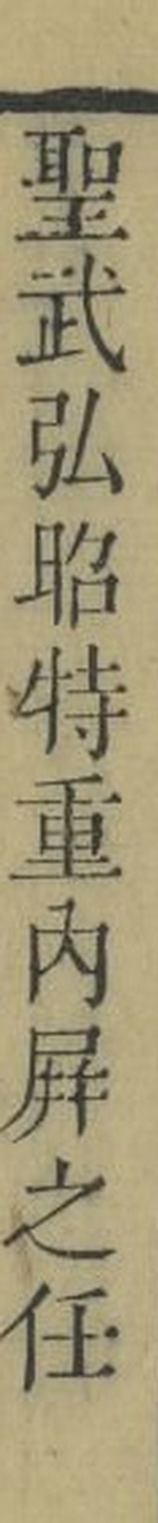聖武弘昭特重内屛之任
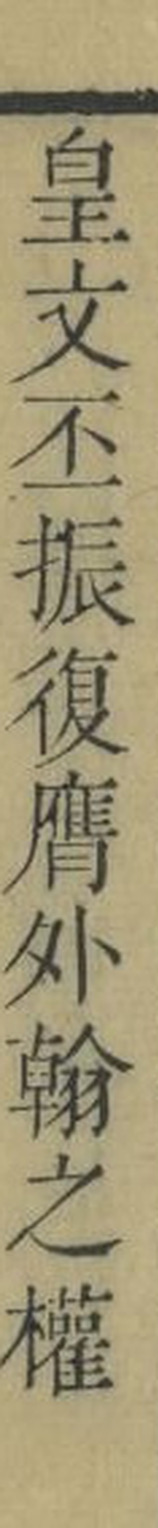皇文丕振復膺外翰之權
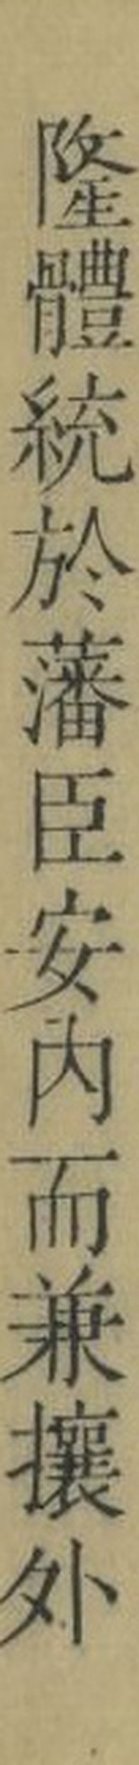隆體統於藩臣安内而兼攘外

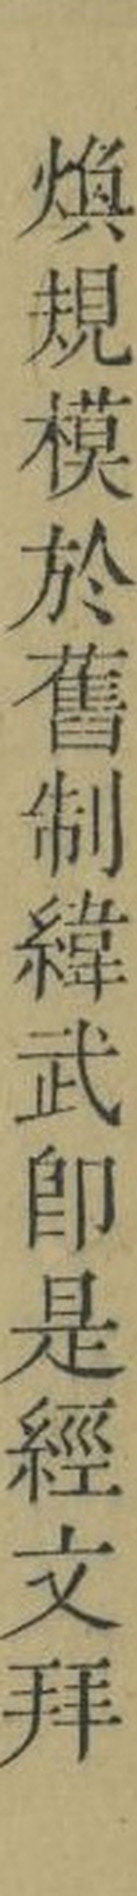煥規模於舊制緯武卽是經文拜
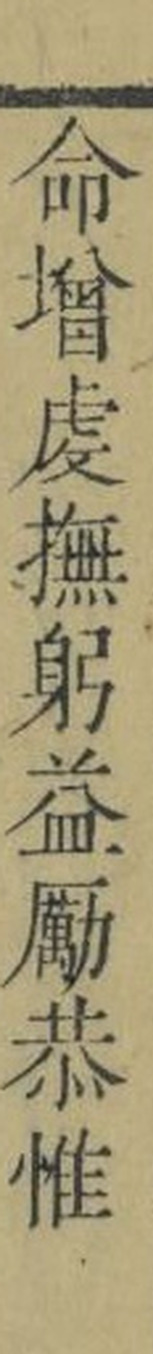命增虔撫躬益勵恭惟
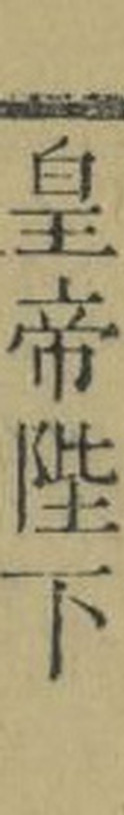皇帝陛下
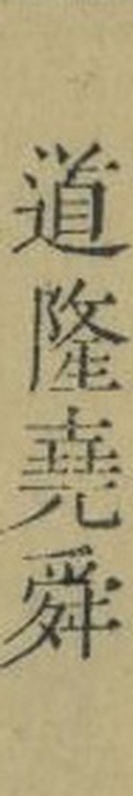道隆堯舜
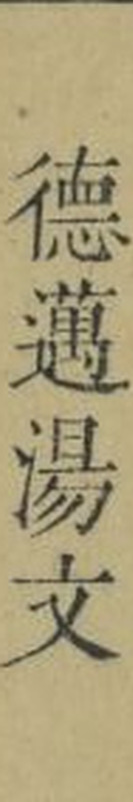德邁湯文
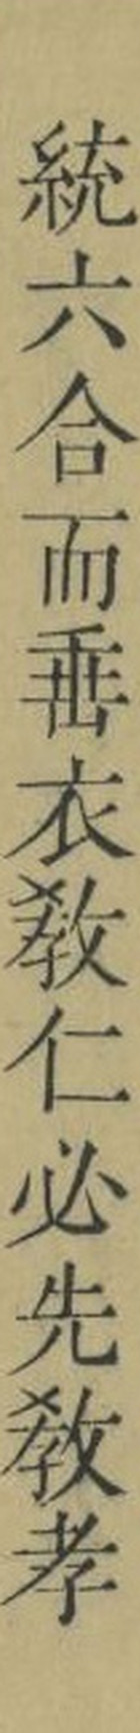統六合而垂衣敎仁必先敎孝
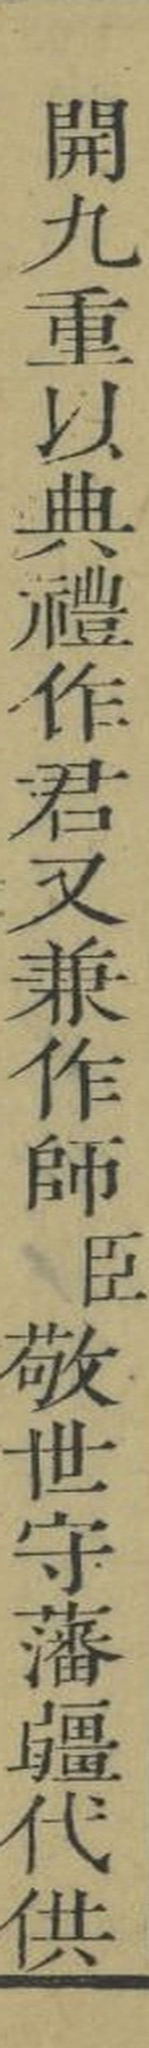開九重以典禮作君又兼作師臣敬世守藩疆代供
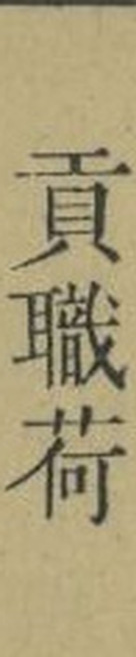貢職荷
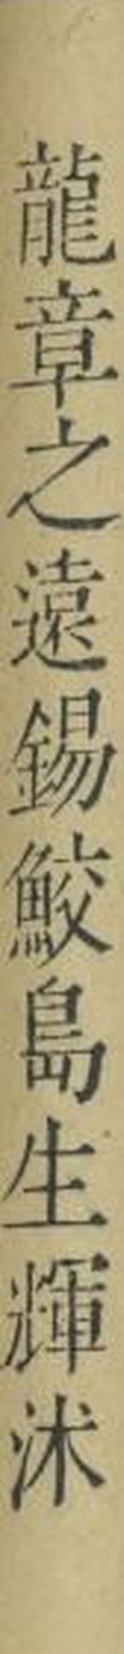龍章之遠錫鮫島生輝洣
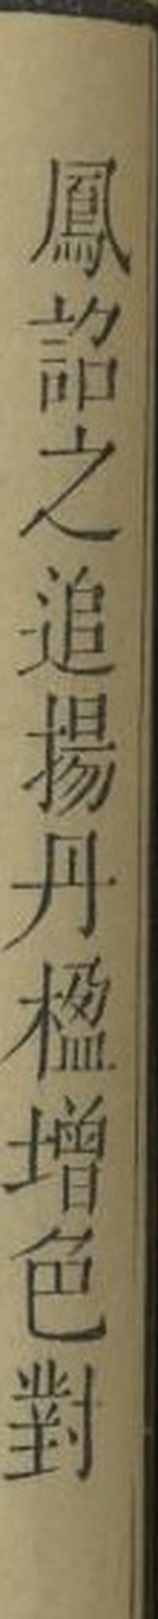鳳詔之追揚丹楹增色對
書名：中山伝信録 巻二
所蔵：University of the Ryukyus Library
